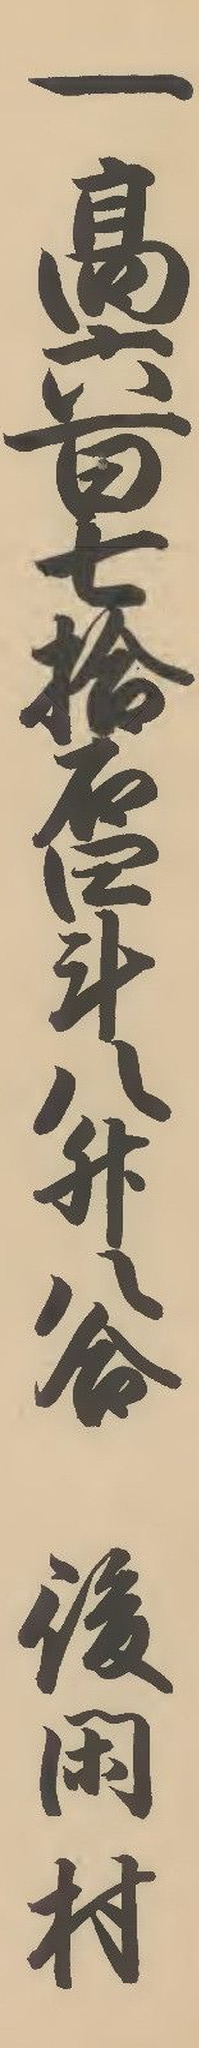一髙六百七拾石四斗八升八合後閑村
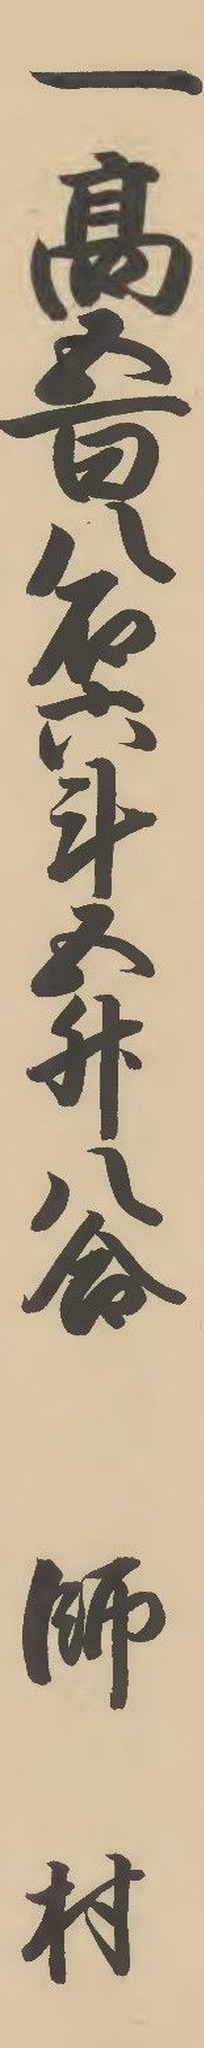一髙五百八石六斗五升八合師村
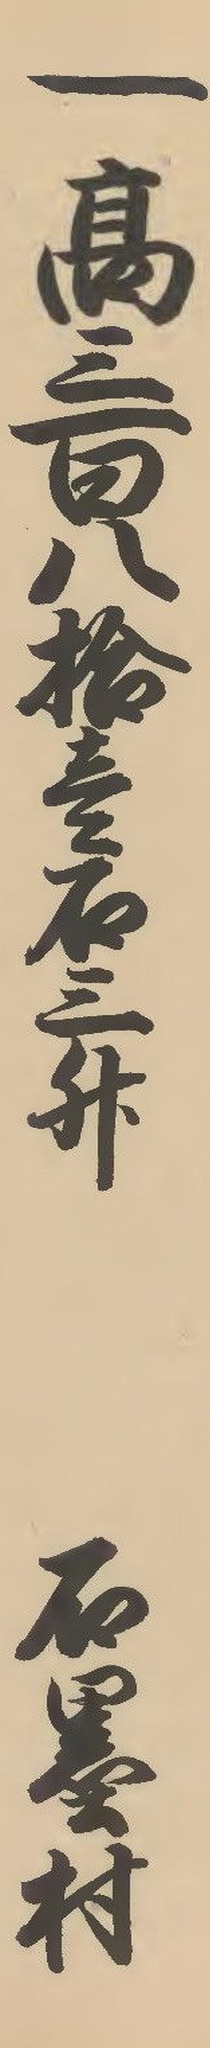一髙三百八拾壱石三升石墨村
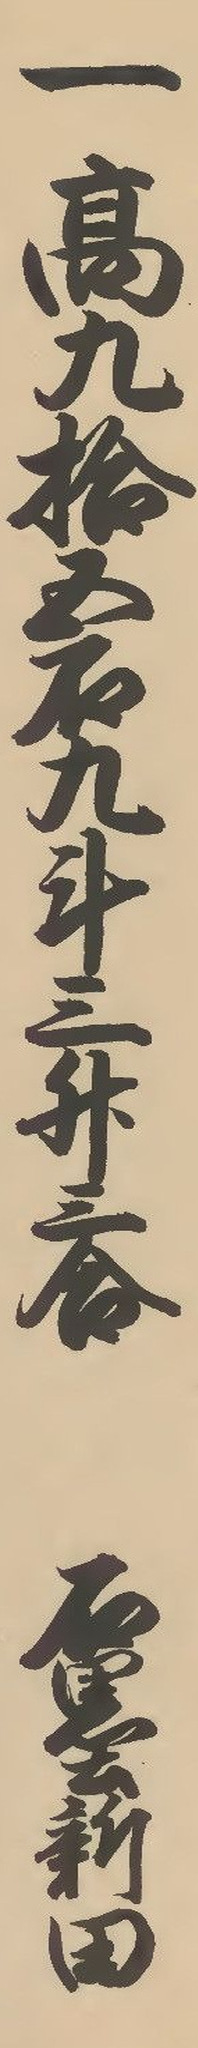一髙九拾五石九斗三升三合石墨新田
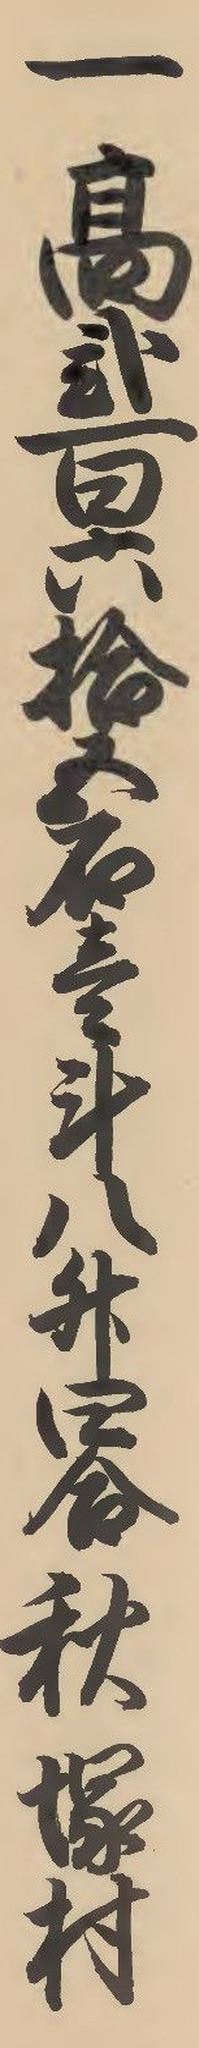一髙弐百六拾五石壱斗八升四合秋塚村
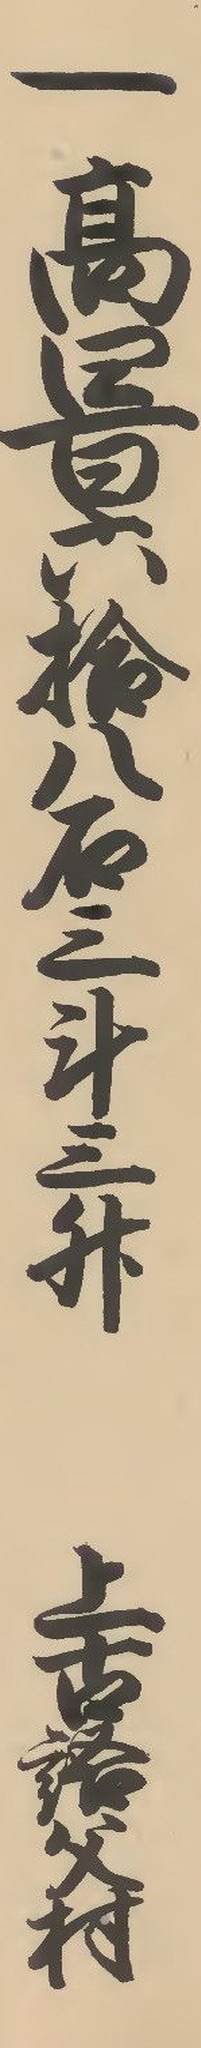一髙四百六拾八石三斗三升上古語父村
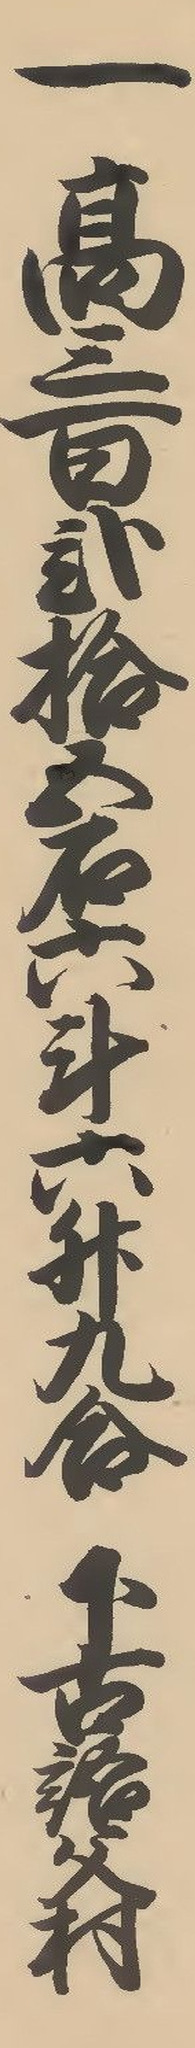一髙三百弐拾五石六斗六升九合下古語父村
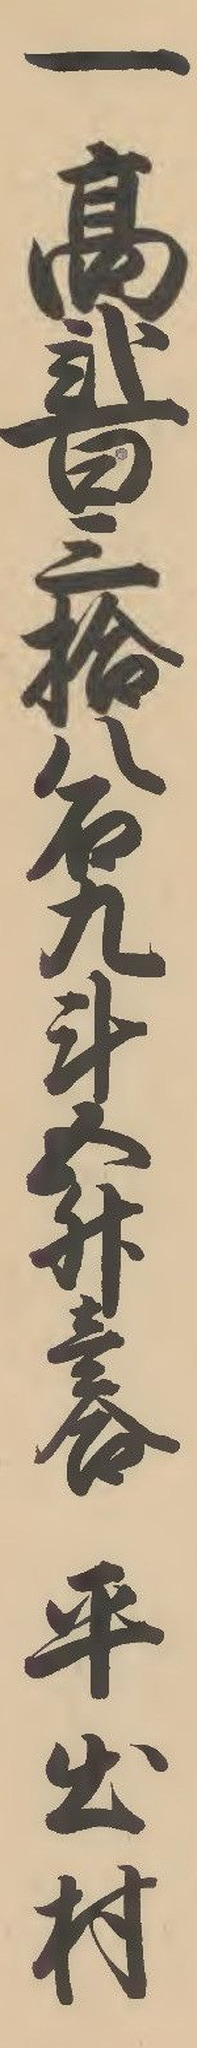一髙弐百三石八石九斗五升壱合平出村

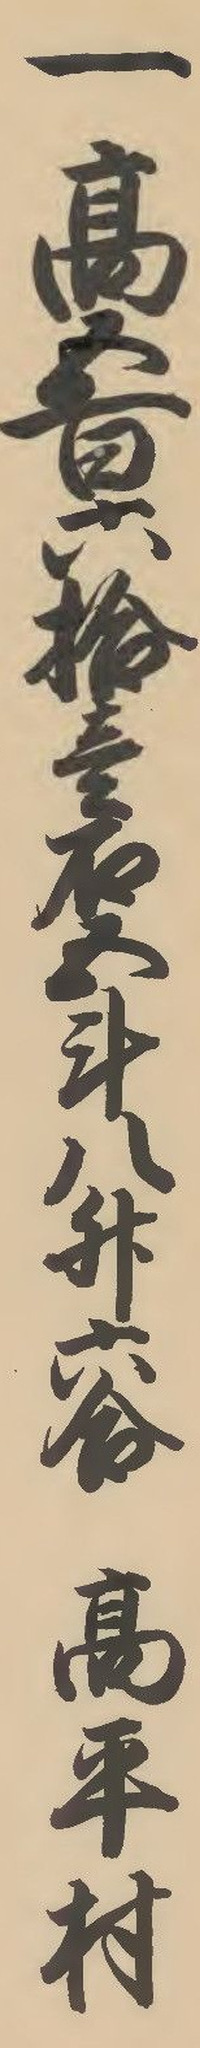一髙五百六拾壱石五斗八升六合髙平村
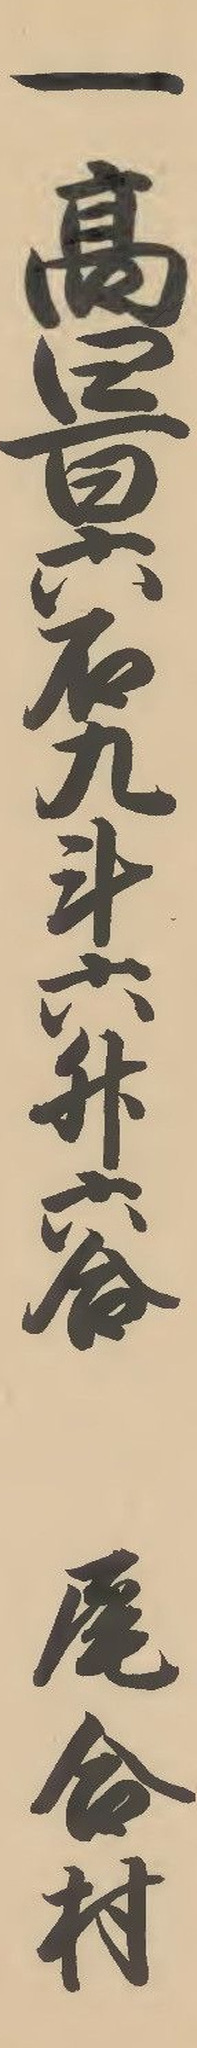一髙四百六石九斗六升六合尾合村
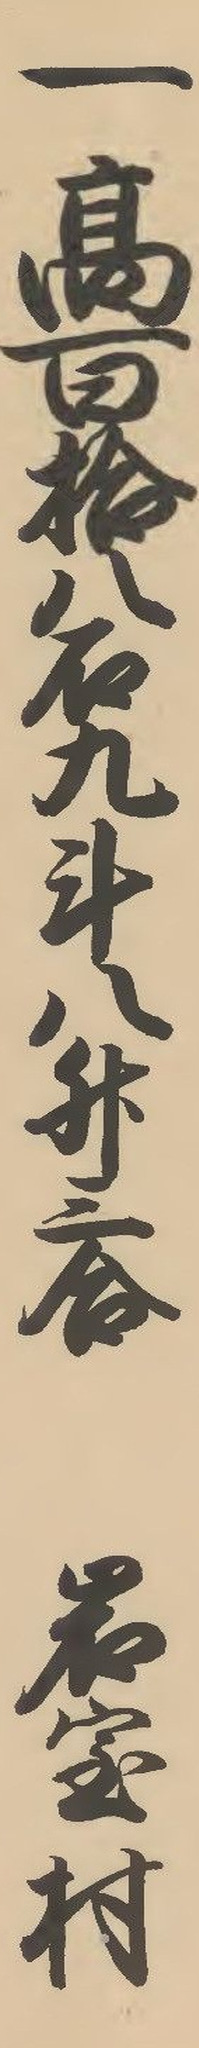一髙百拾八石九斗八升三合岩室村
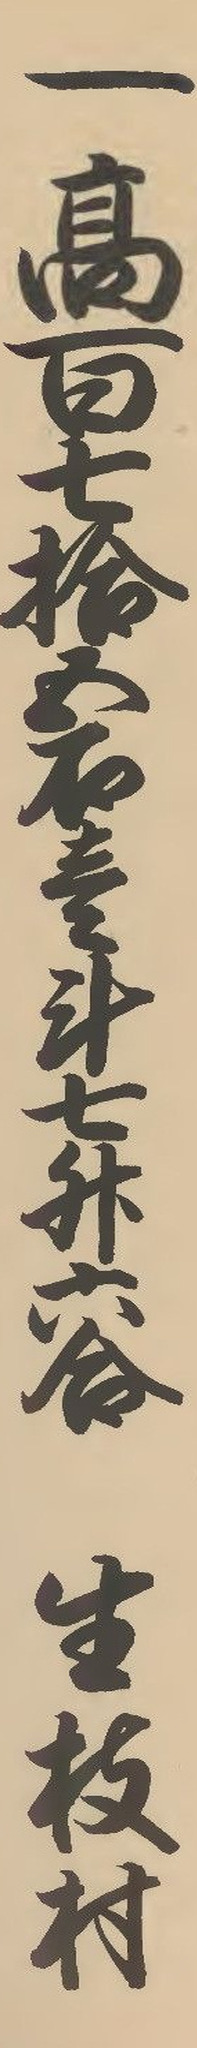一髙百七拾五石壱斗七升六合生枝村
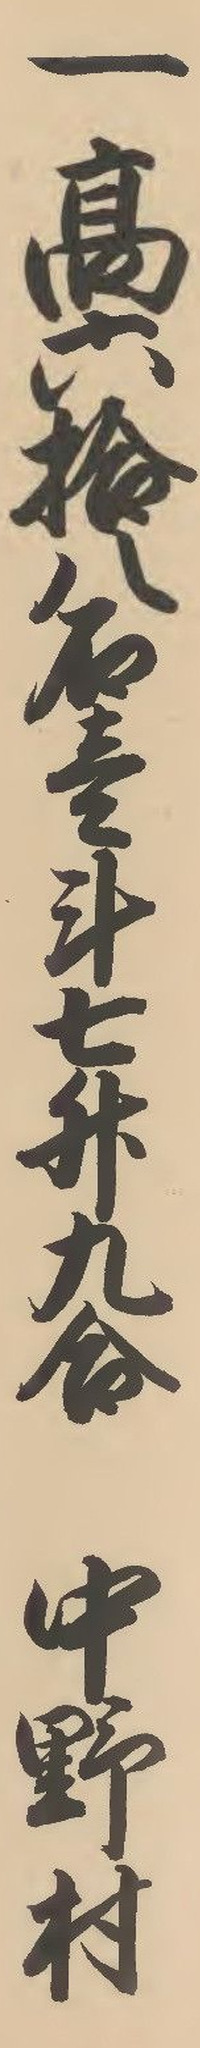一髙六拾八石壱斗七升九合中野村
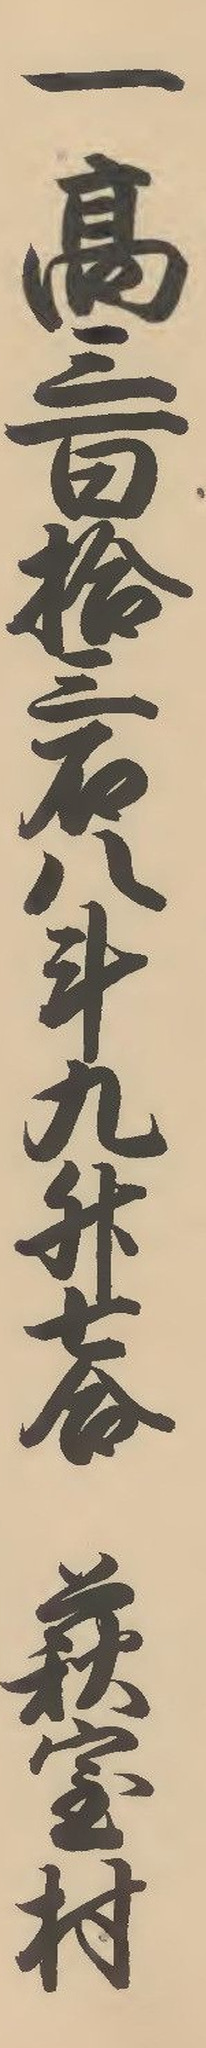一髙三百拾三石八斗九升七合萩室村
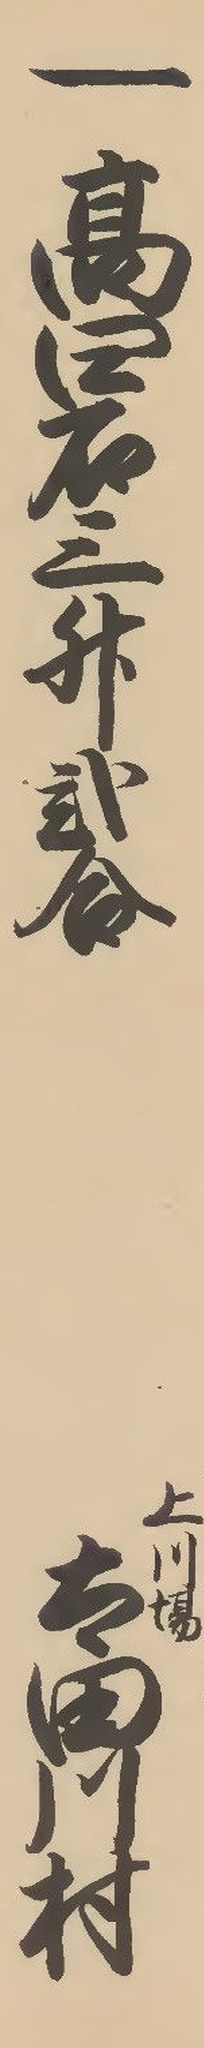一髙四石三升弐合太田川村
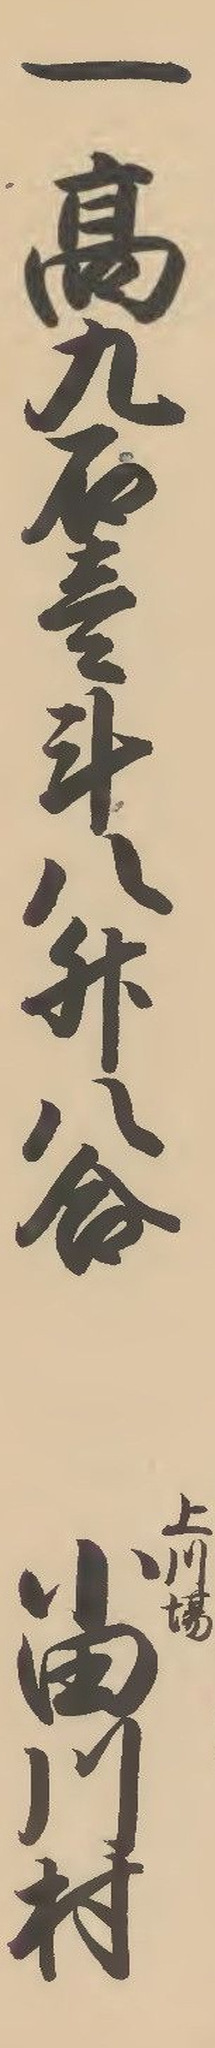一髙九石壱斗八升八合小田川村
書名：上野国郷帳
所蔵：国立公文書館 National Archives of Japan
